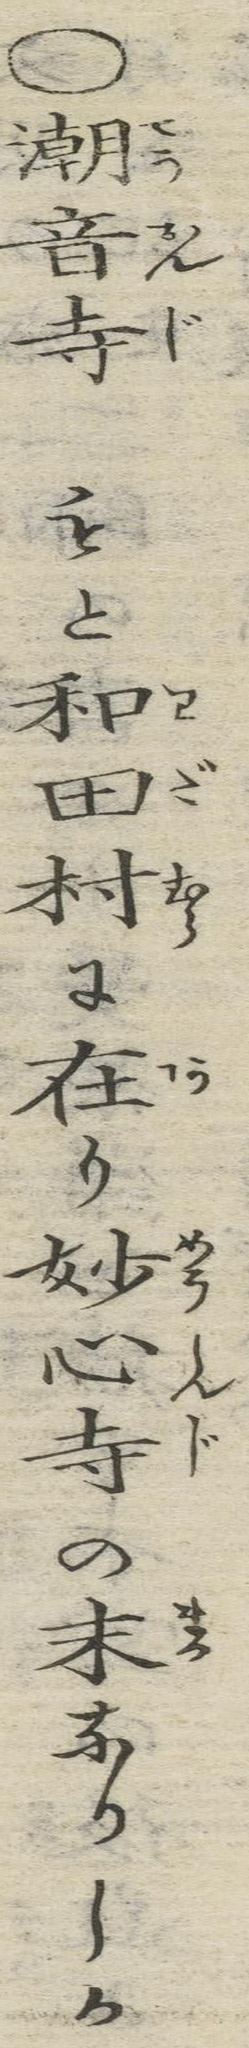○潮音寺もと和田村に在り妙心寺の末なりしか
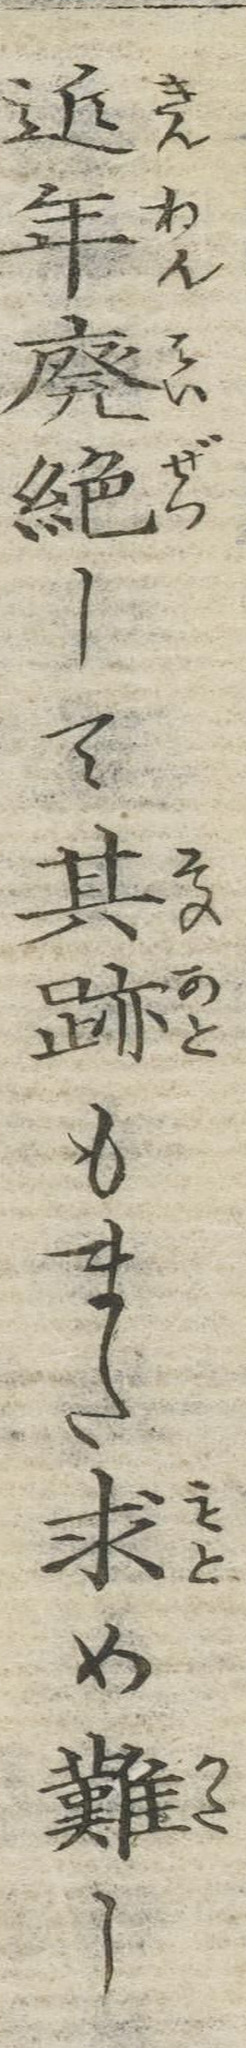近年廃絶して其跡もまた求め難し
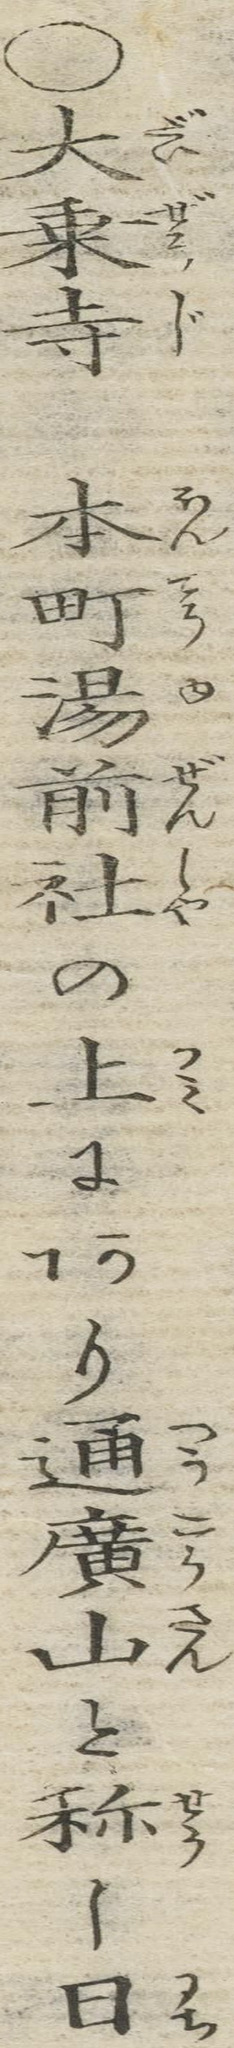○大乗寺本町湯前社の上にあり通広山と称し日
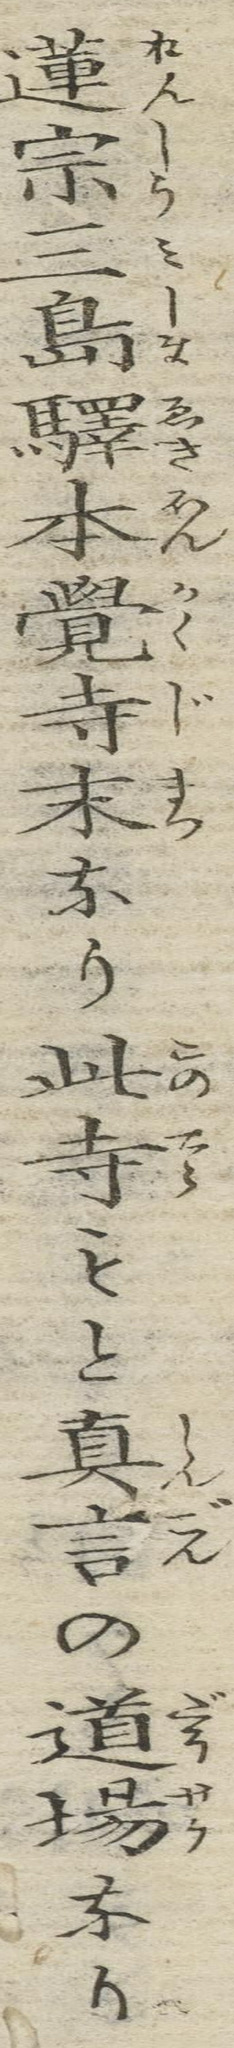蓮宗三島駅本覚寺末なり此寺もと真言の道場なり
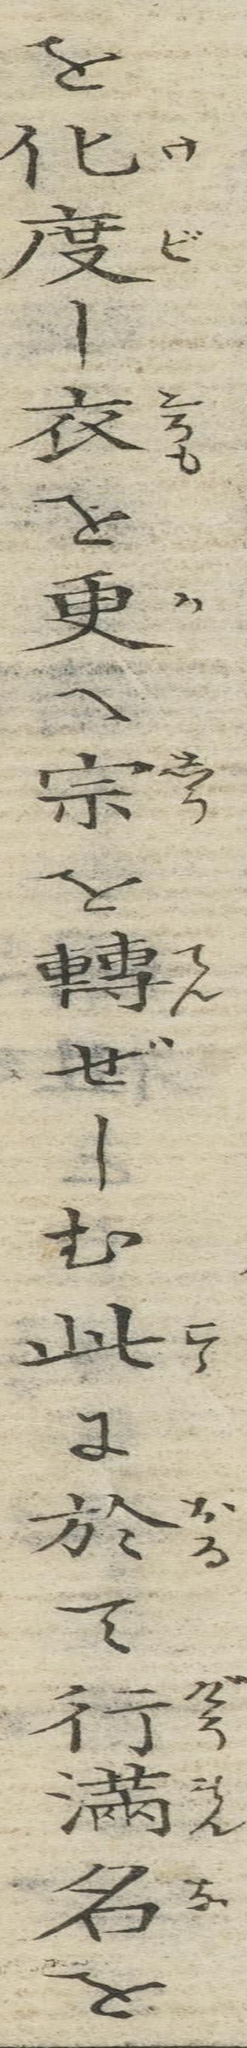を化度し衣を更へ宗を転ぜしむ此に於て行満名を

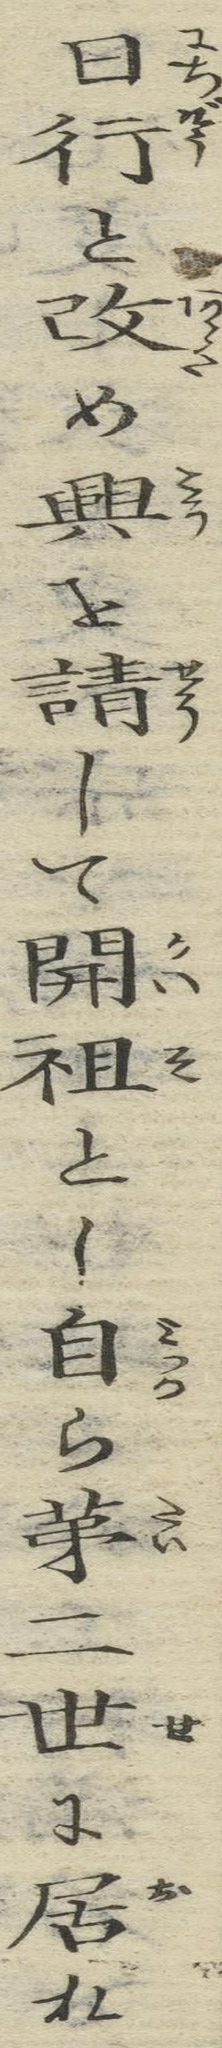日行と改め興を請して開祖とし自ら第二世に居れ
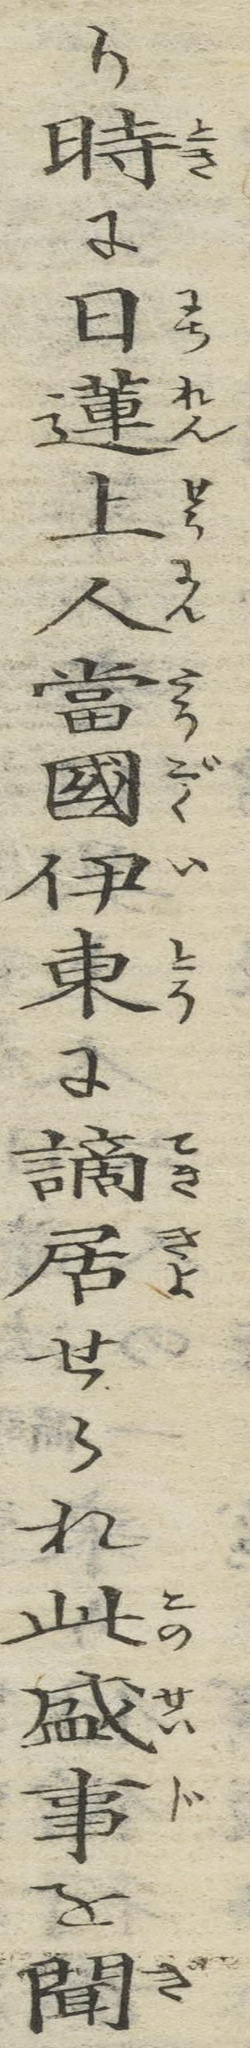り時に日蓮上人当国伊東に謫居せられ此の盛事を聞
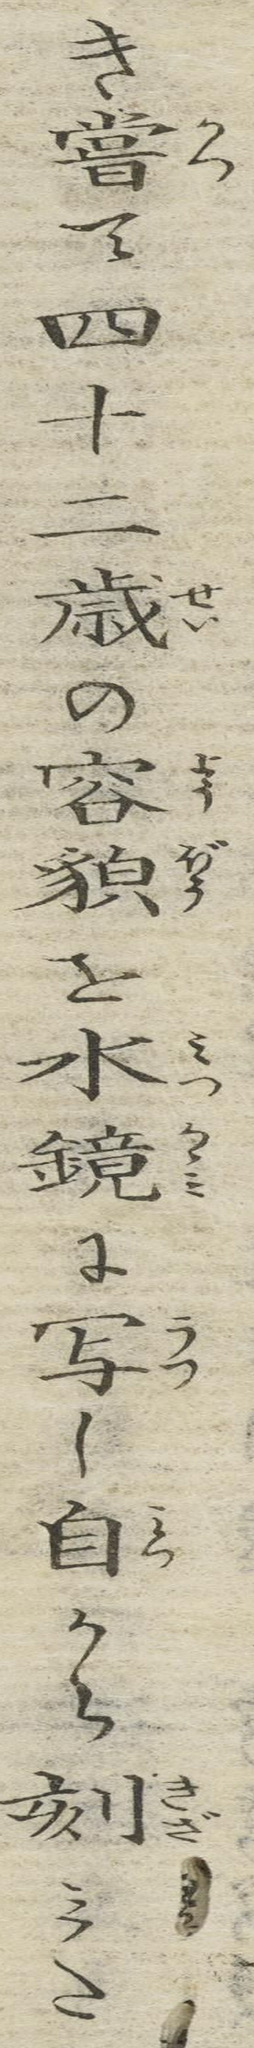き嘗て四十二歳の容貌を水鏡に写し自から刻みた
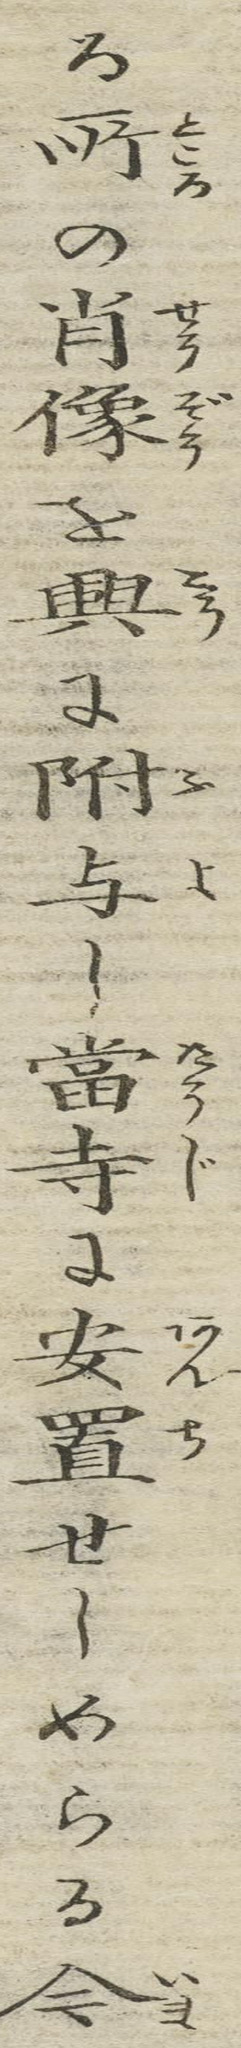る所の肖像を興に附与し当寺に安置せしめらる今
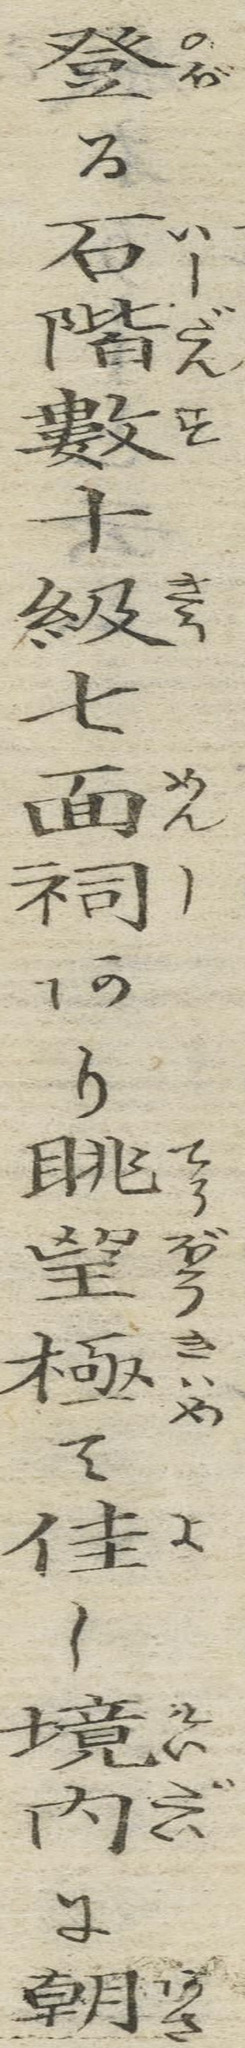登る石階数十級七面祠あり眺望極て佳し境内に朝
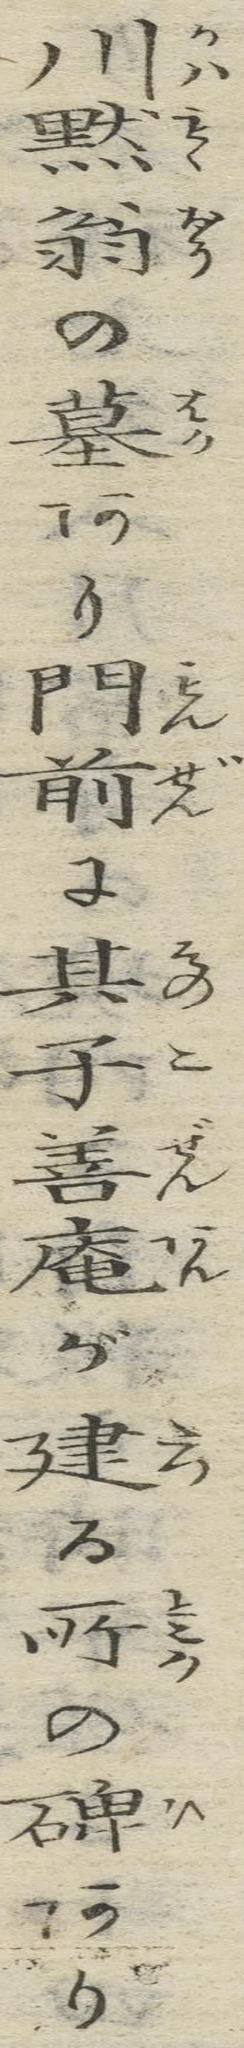川黙翁の墓あり門前に其子善庵が建る所の碑あり
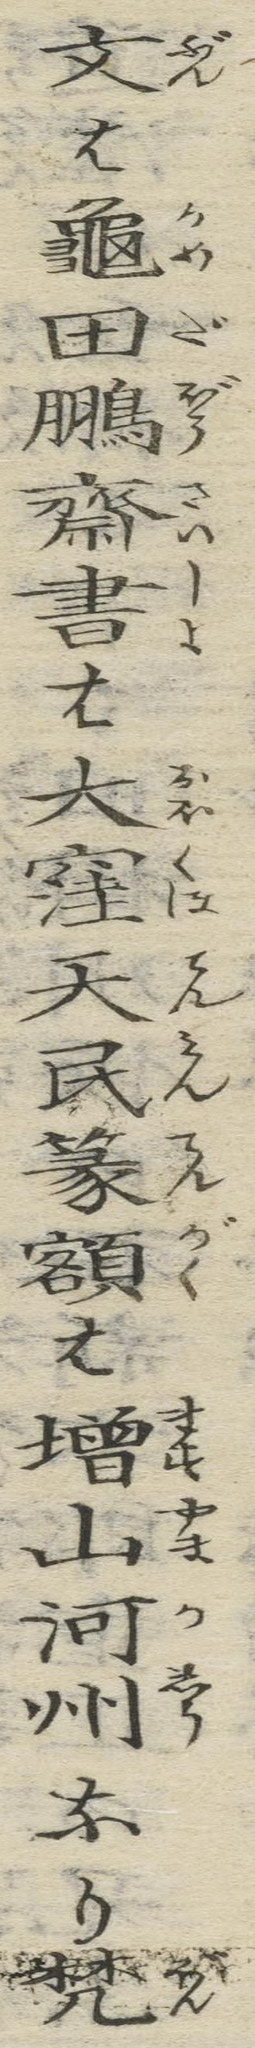文は亀田鵬齋書は大窪天民ﾞ篆額は増山河州なり梵
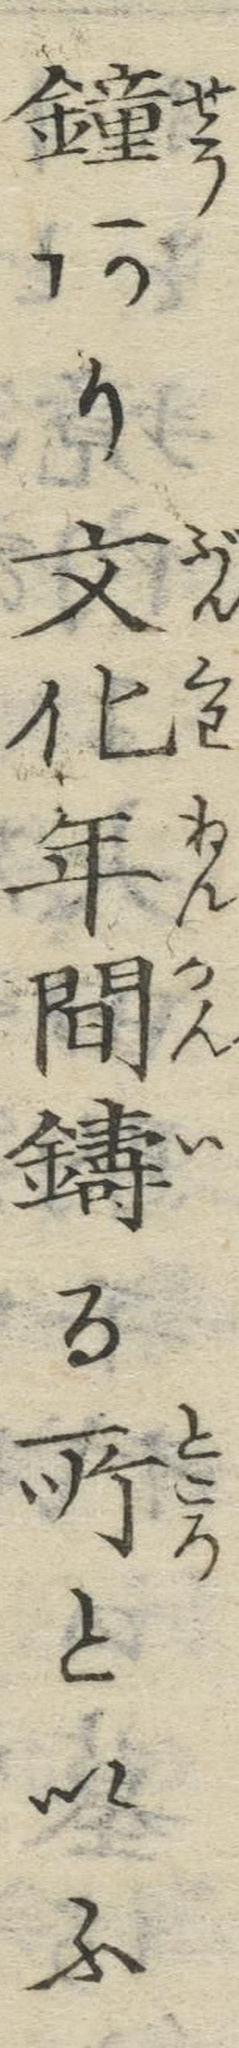鐘あり文化年間鋳る所といふ
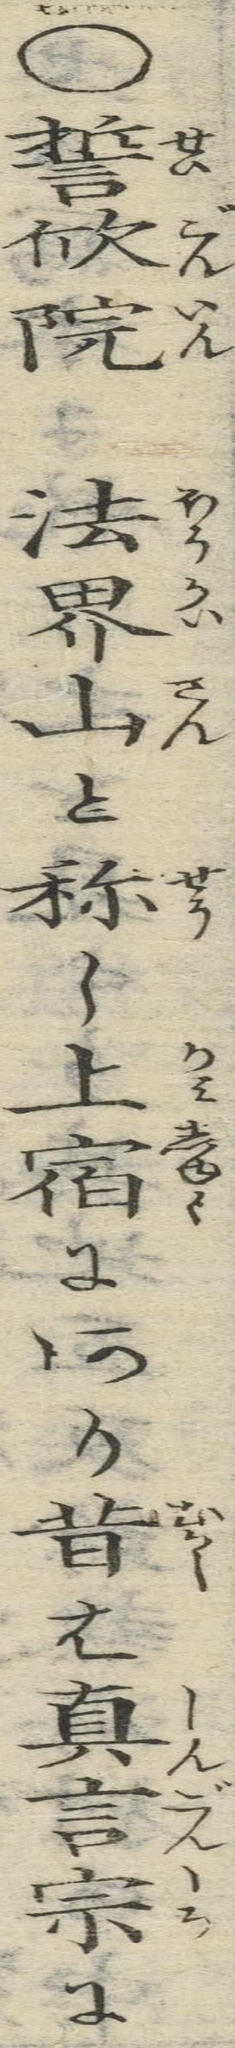〇誓欣院法界山と称し上宿にあり昔は真言宗に
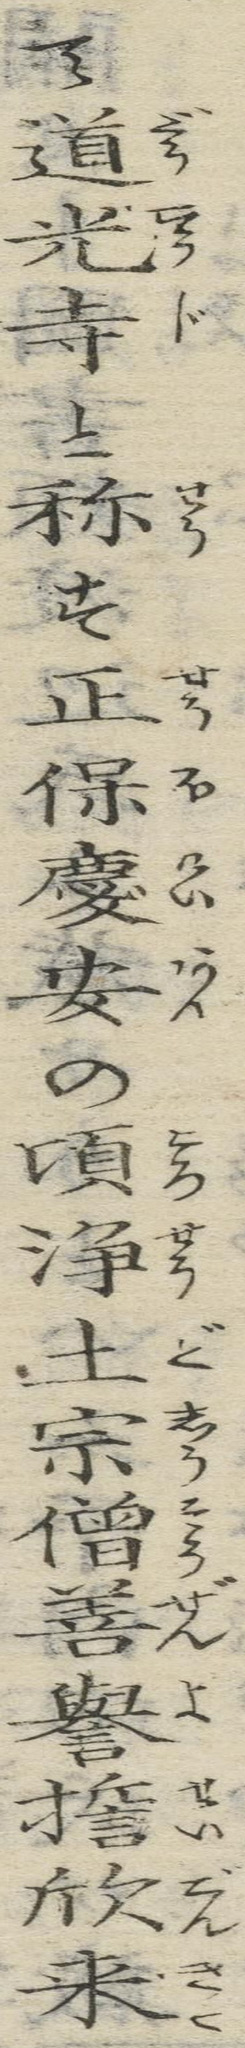て道光寺と称す正保慶安の頃浄土宗僧善誉誓欣来
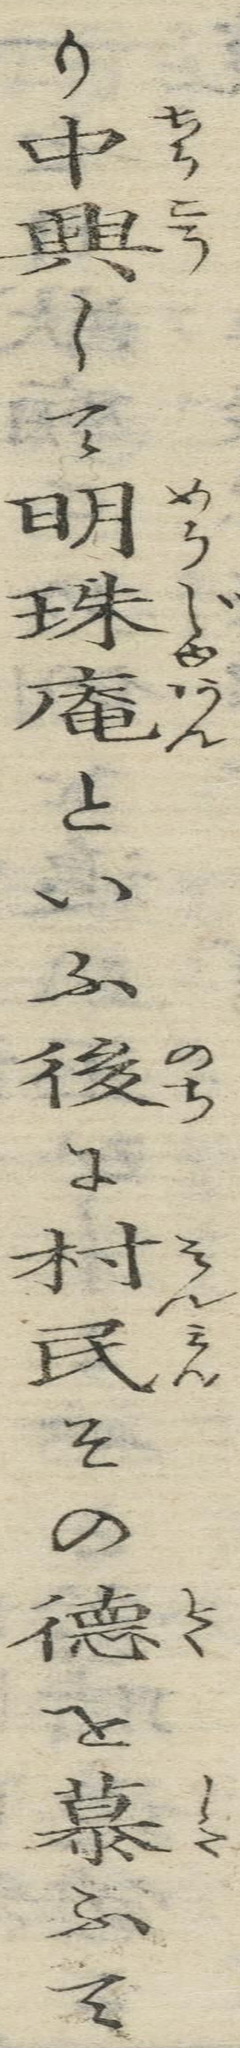り中興して明珠庵といふ後に村民その徳を慕ふて
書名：豆州熱海誌　完
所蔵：東京大学地震研究所図書室 Earthquake Research Institute Library, The University of Tokyo, JAPAN
